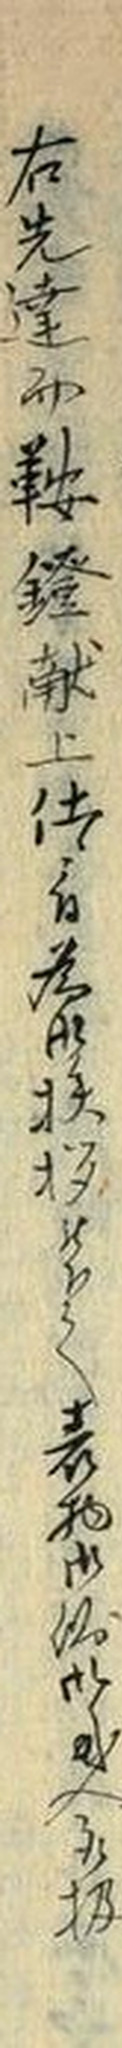右先達而鞍鐙献上仕候ニ付為御挨拶被下之表物御側御用人取扱
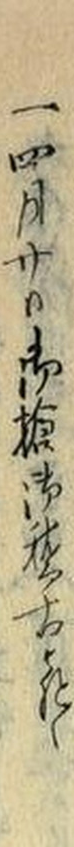一四月廿日御槍御稽古被遊候
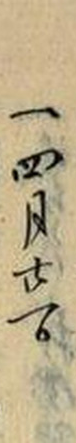一四月廿一日
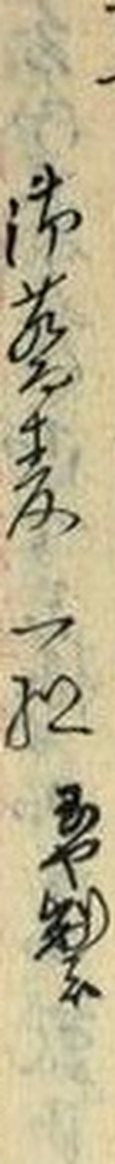御蕎麦一組玉や製
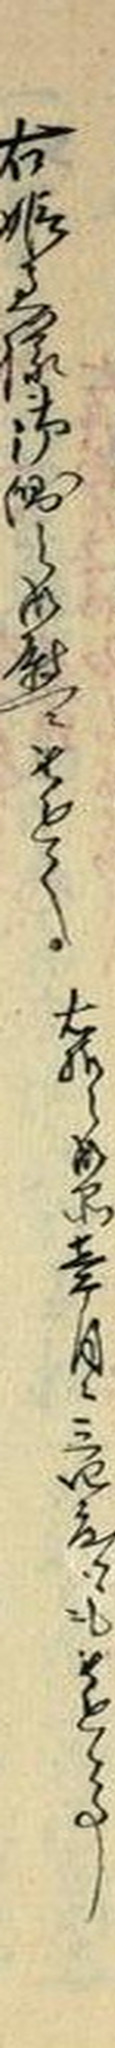右姫君様御側之御慰ニ被進之右様之御品壱月ニ三四度ツヽも被進候事
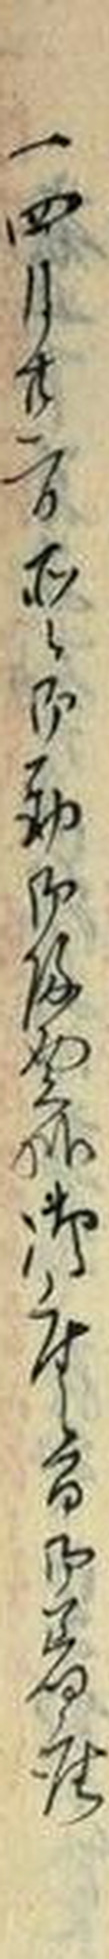一四月廿二日所々御勤御帰殿掛御座之間御着座
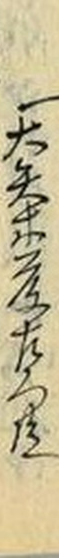大矢木藤左衛門殿
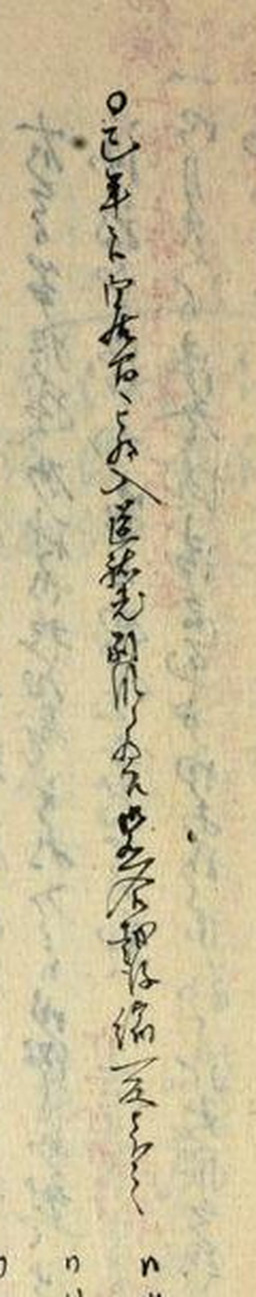○巳年ニハ御居間へ被為入道祐老別段被為召御有合越後縮一反被下之
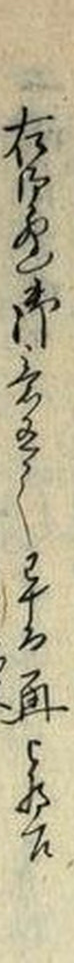右御逢御意有之畢而再被為召
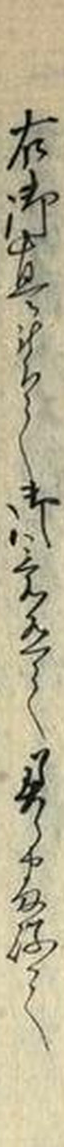右御直々被下之御意有之奥之番役之
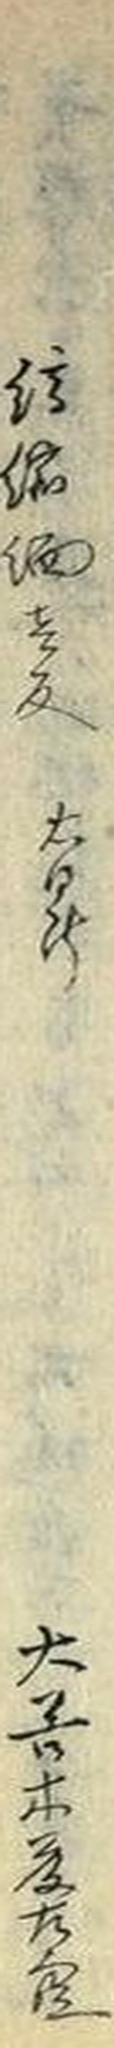縞縮緬壱反右同断大谷木藤左衛門殿
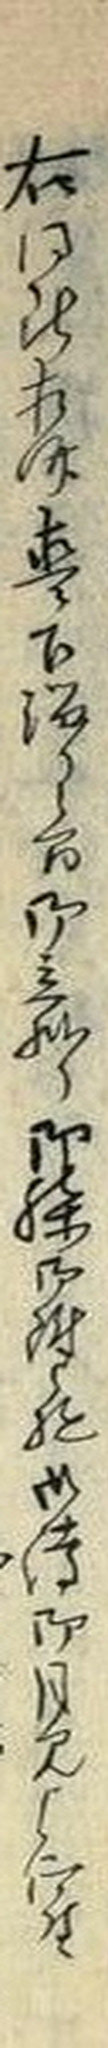右同断相済直ニ下溜之間御立掛り御膝御附被遊御侍御目見被仰付候

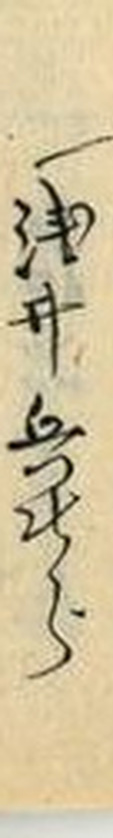浅井兵次郎
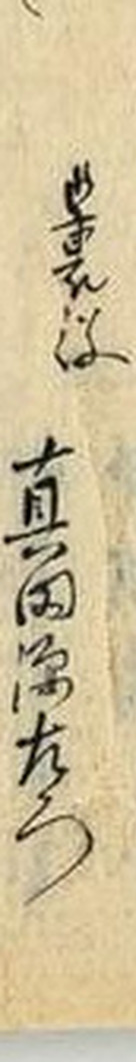真田源左衛門
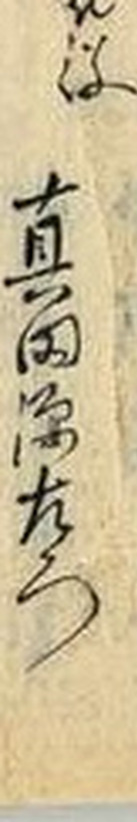真田源左衛門
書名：少傅日録抄（斉承付側向頭取日記、在府）
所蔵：福井県文書館 Fukui Prefectural Archives
